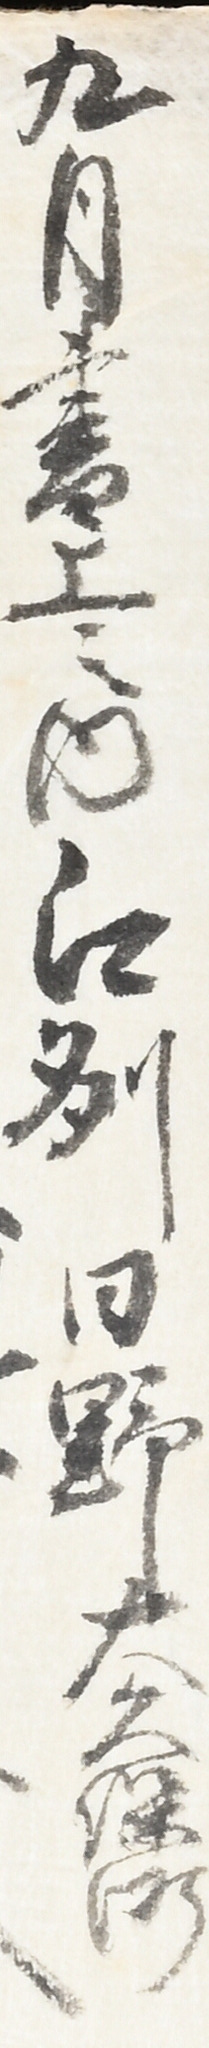九月書上之内江州日野大久保町
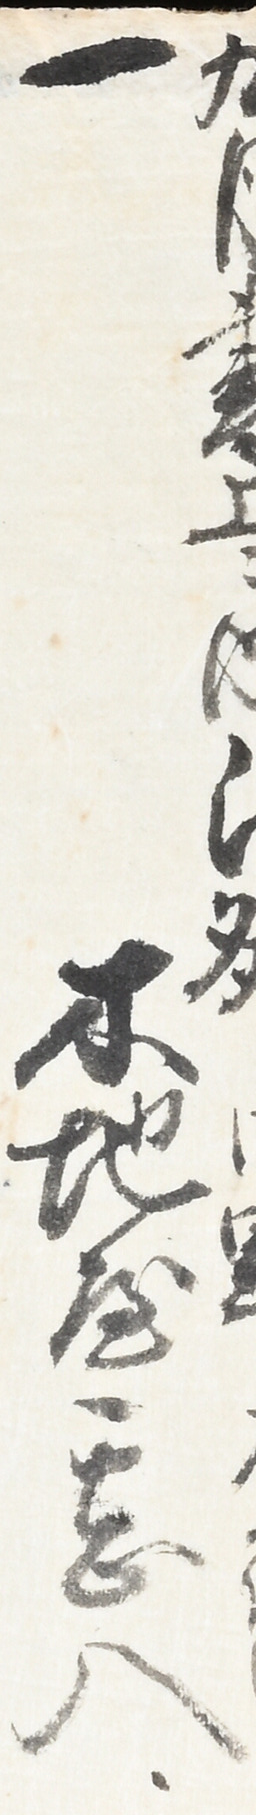一木地屋甚八・
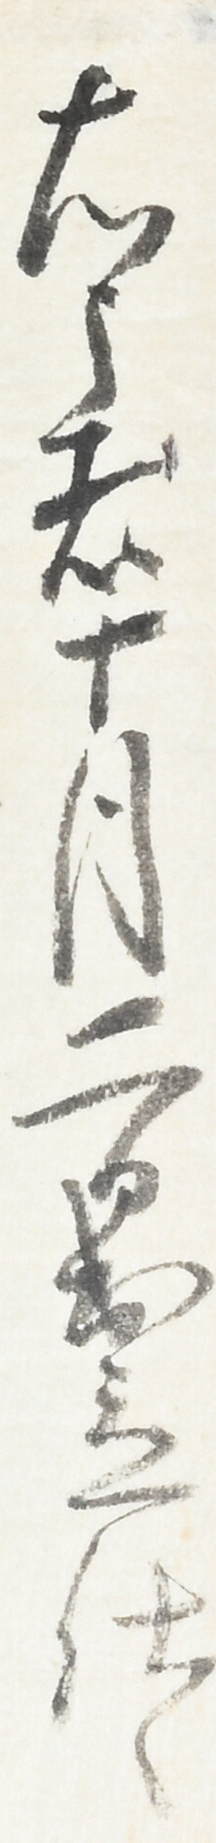右之者十月二日出立仕候

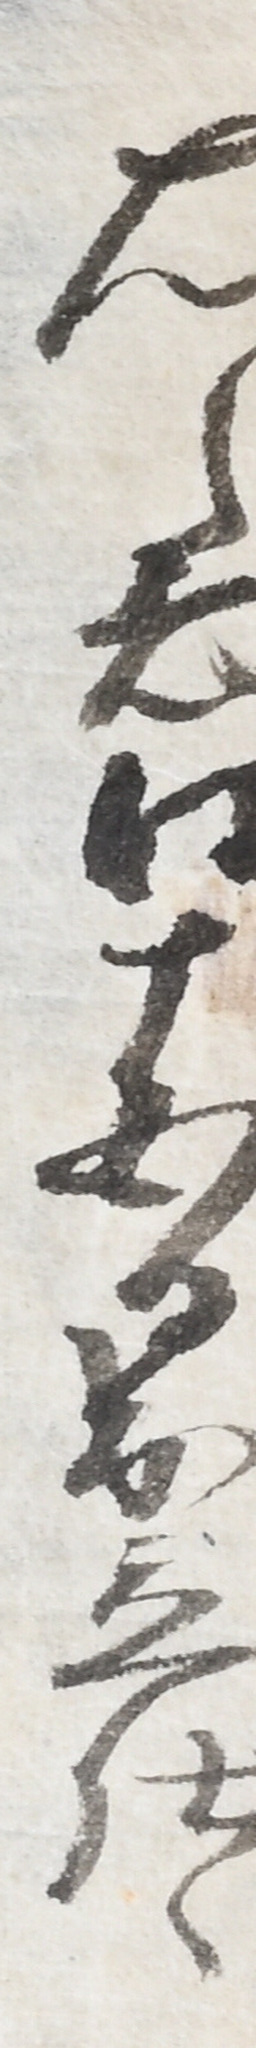右之者同十日出立仕候
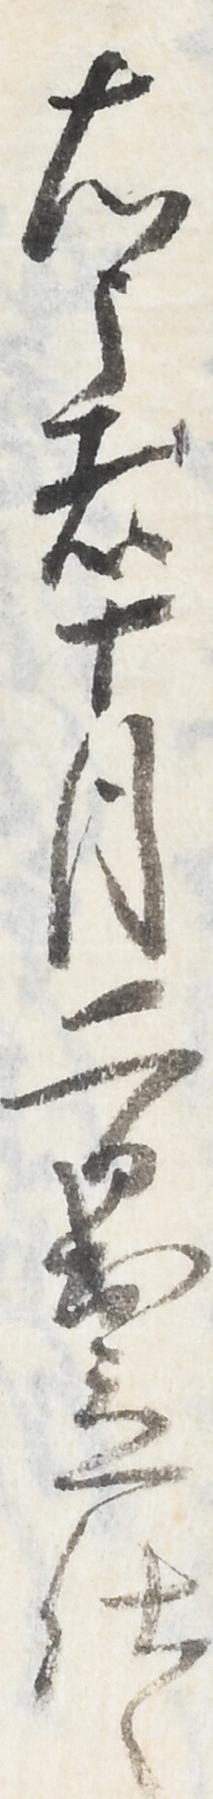右之者共同五日出立仕候
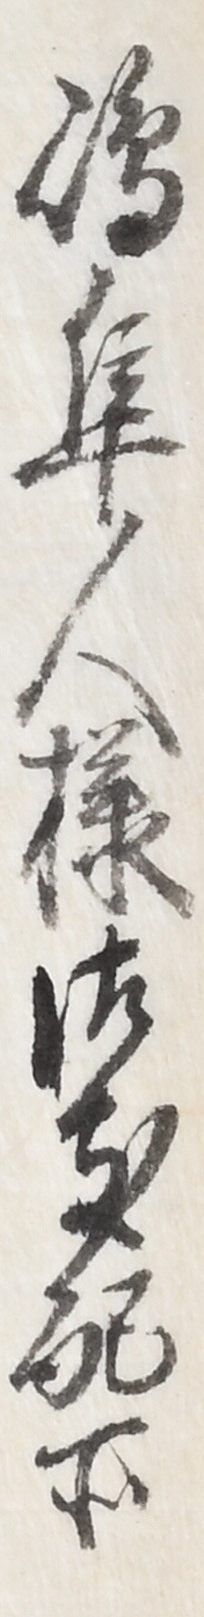嶋隼人様御支配所
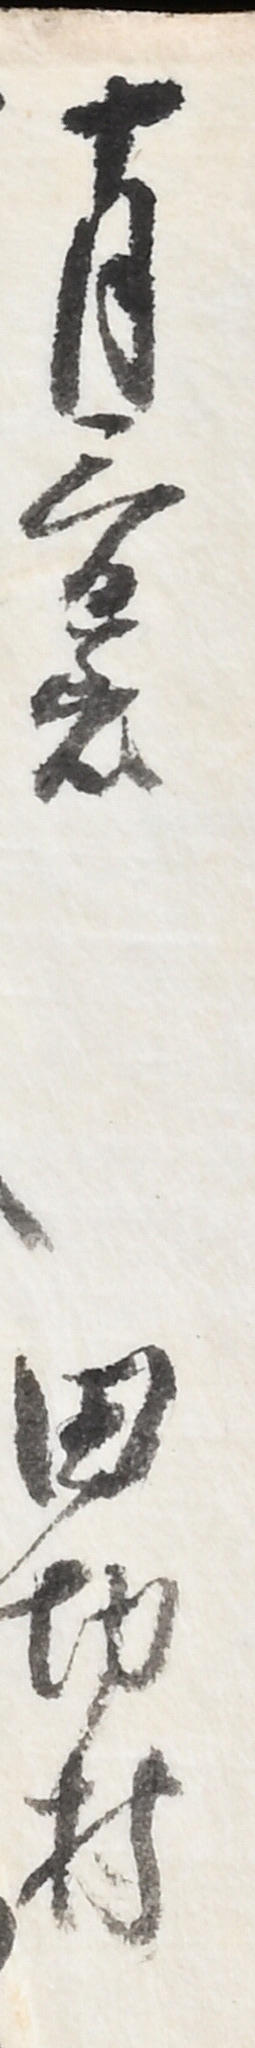十月三日着田切村
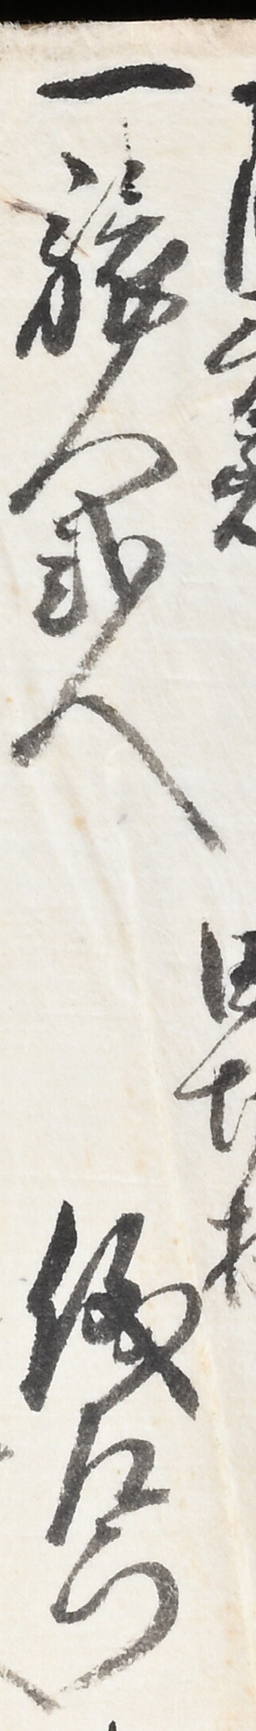一旅人弐人義左衛門・
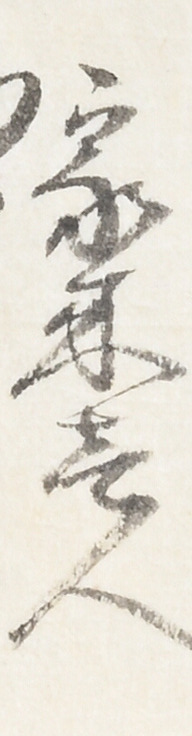家来壱人
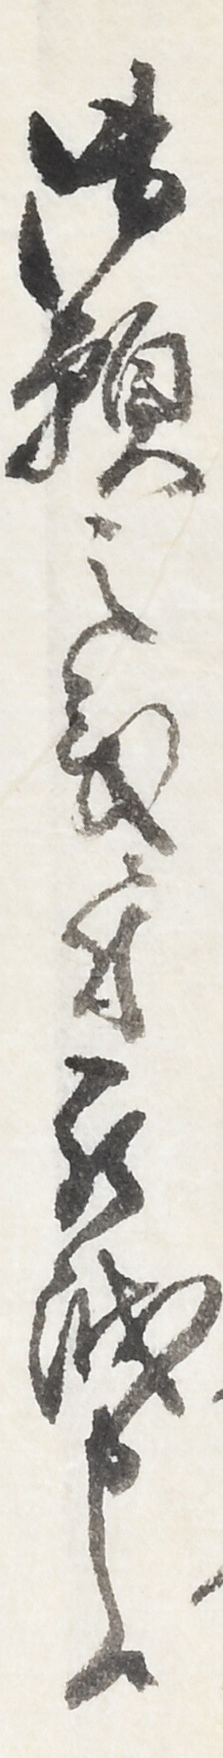御願之義ニ付罷越申候
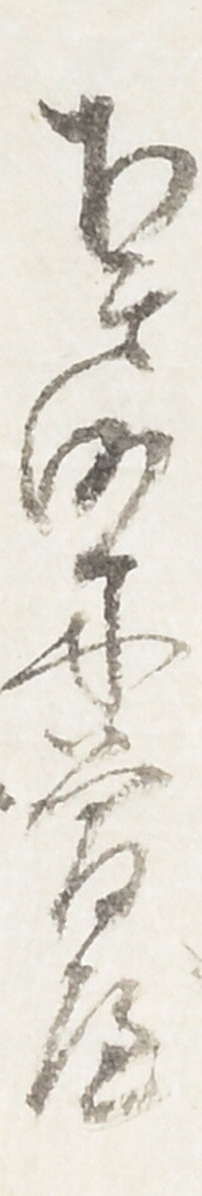下モ町木曽屋
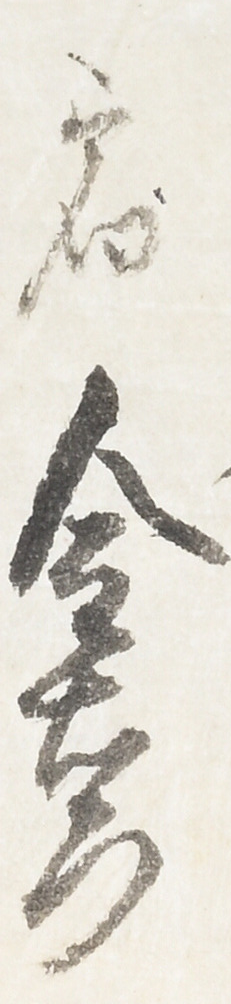宿金右衛門
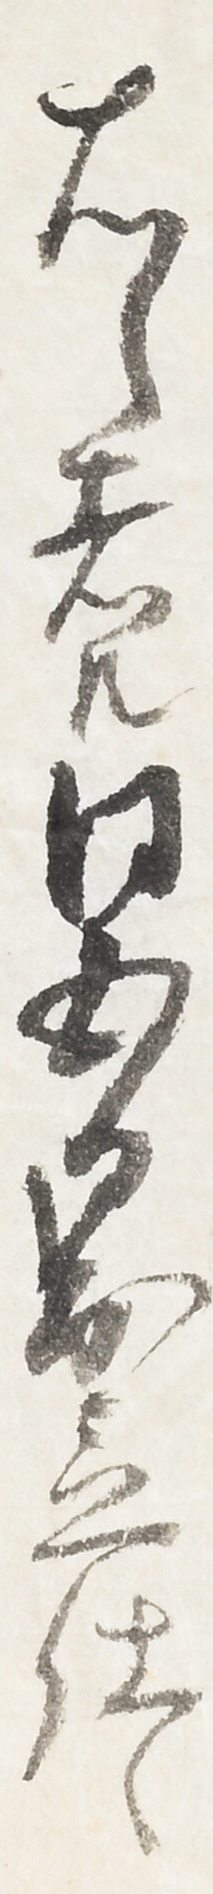右之者共同五日出立仕候
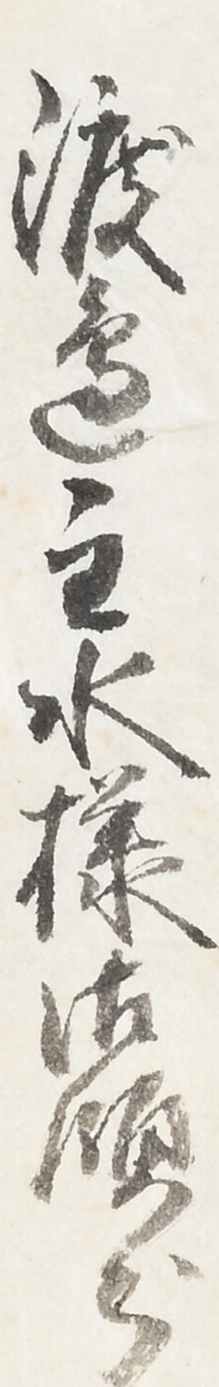渡辺主水様御領分
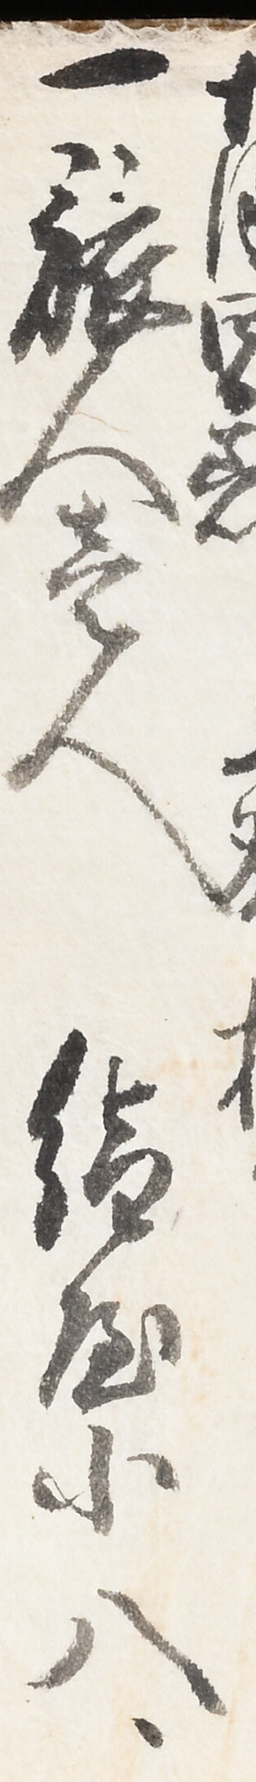一旅人壱人絹屋小八・
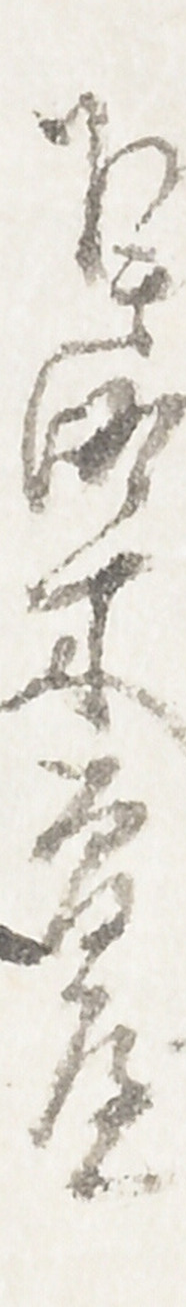下モ町木曽屋
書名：旅人泊控帳
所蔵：伊那市立高遠町図書館・合同会社AMANE
